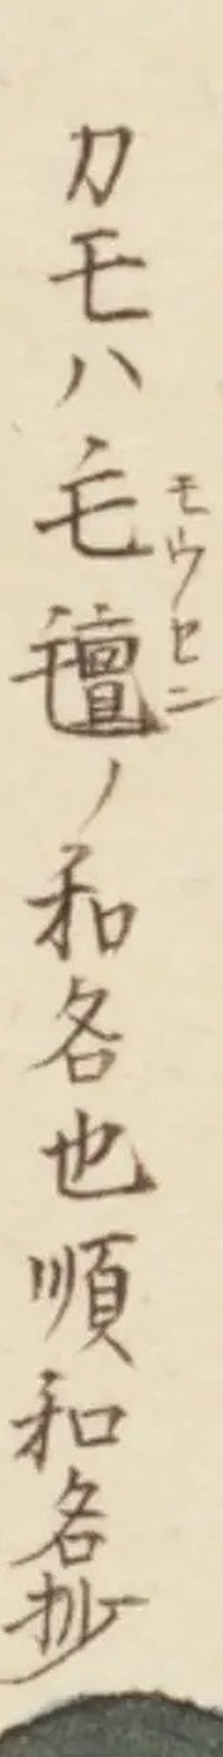カモハ毛氈和名也順和名抄
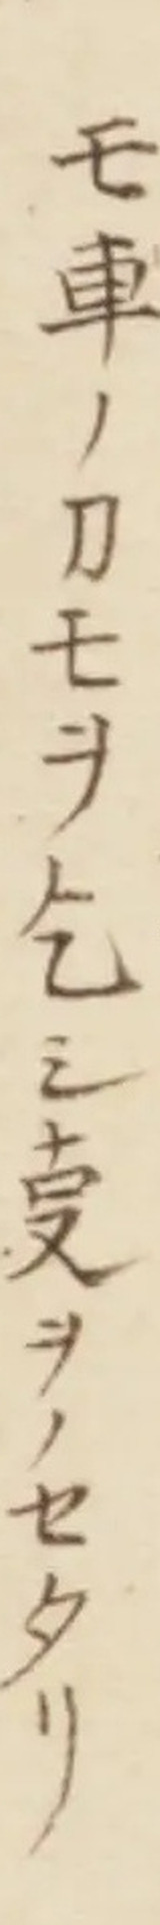モ車ノカモヲ乞シ事ヲノセタリ
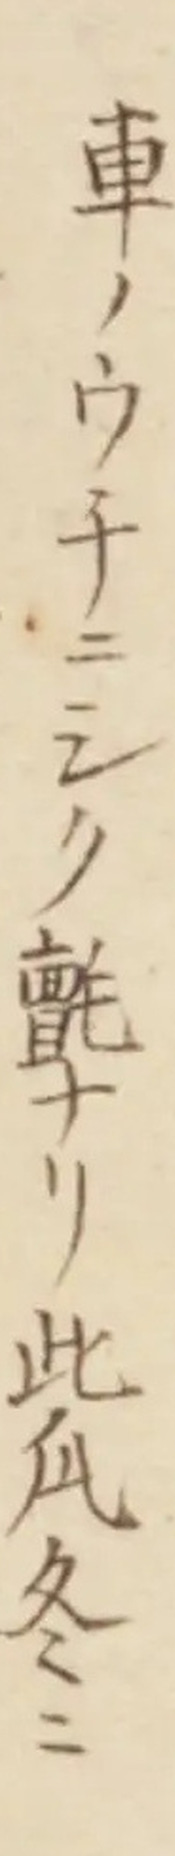車ノウチニシク氈ナリ此瓜冬ニ
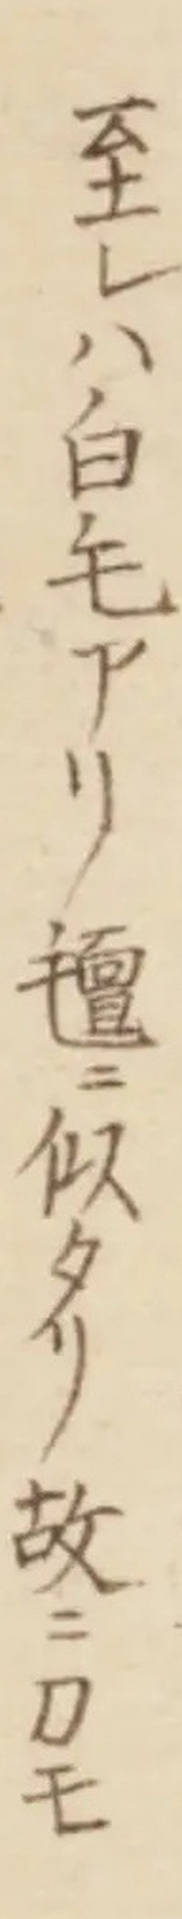至レハ白毛アリ氈似タリ故ニカモ
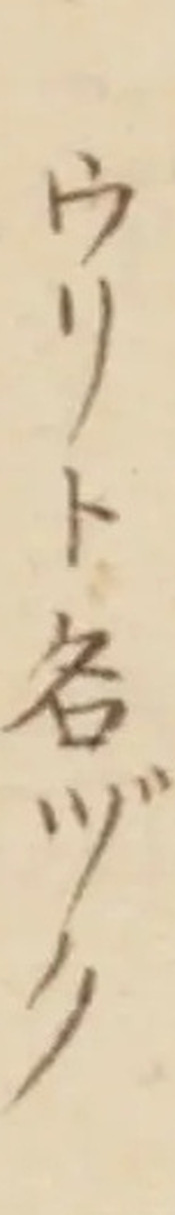ウリト名ヅク
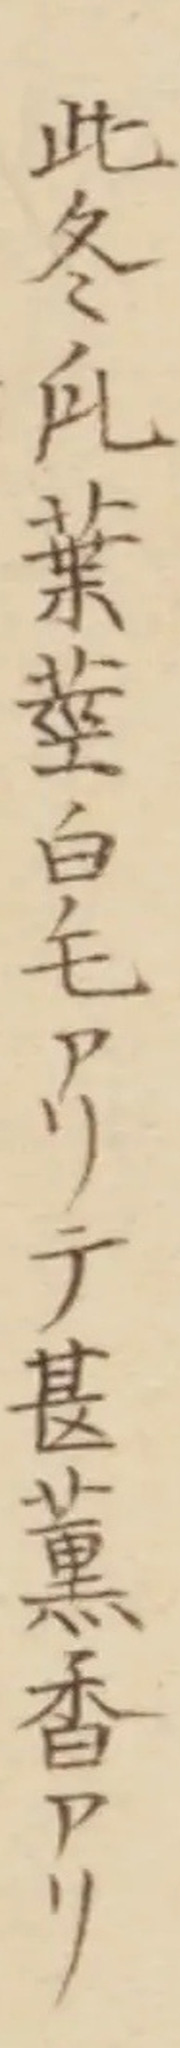此冬瓜葉茎白毛アリテ甚薫香アリ
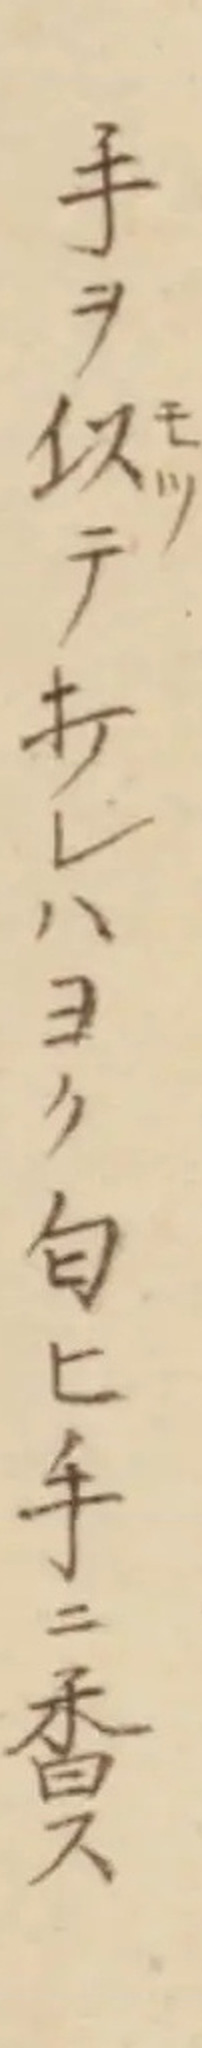手ヲ以テ打レハヨク匂ヒ手ニ香ス

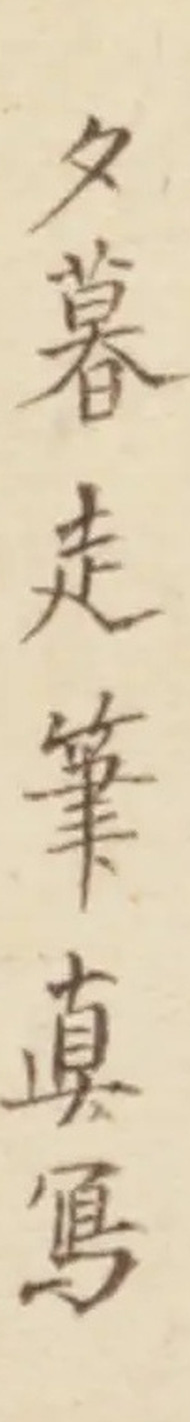夕暮走筆真写
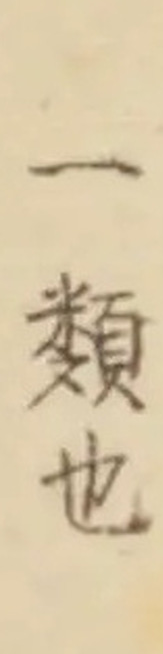一類也

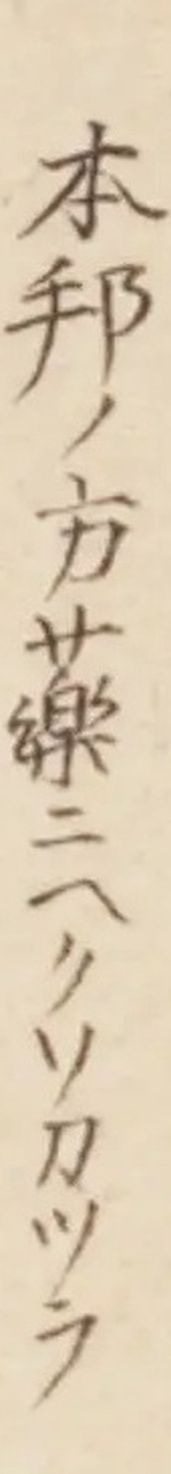本邦ノ方薬ニヘクソカツラ
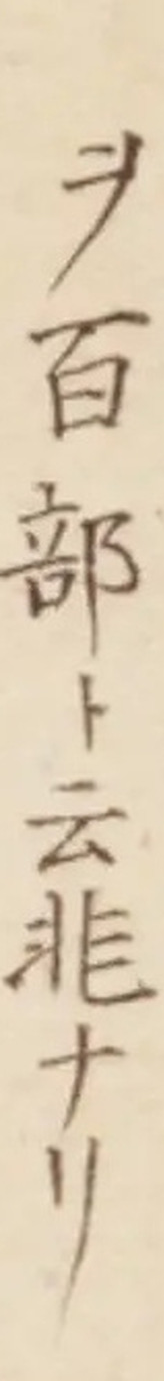ヲ百部云非ナリ
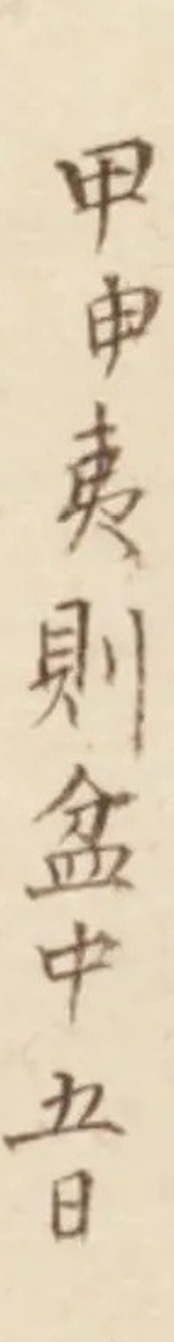甲申夷則盆中五日
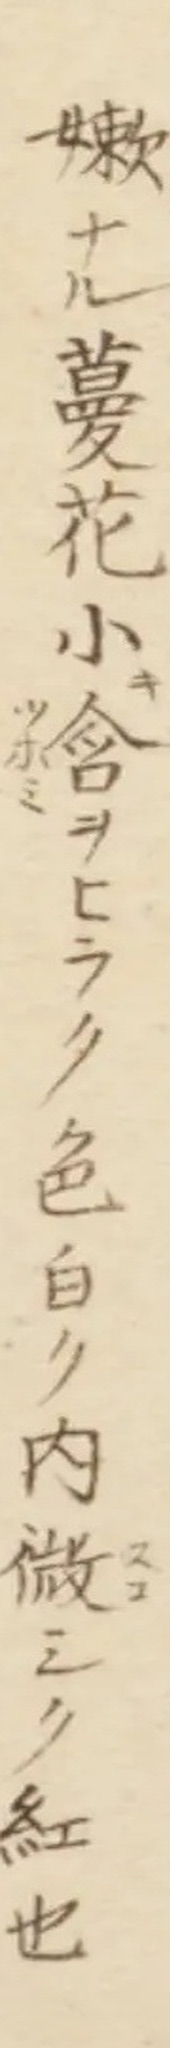嫩ナル蔓花小含ヲヒラク色白ク内微シク紅也
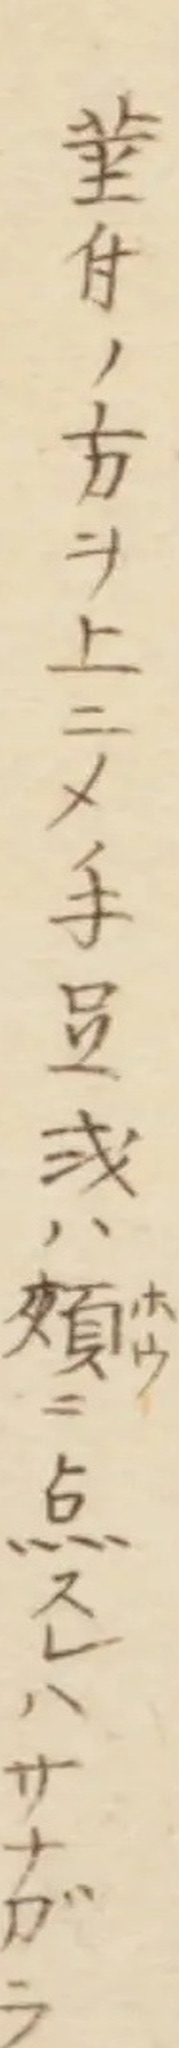茎付ノ方ヲ上ニシテ手足或ハ頬ニ点スレハサナガラ
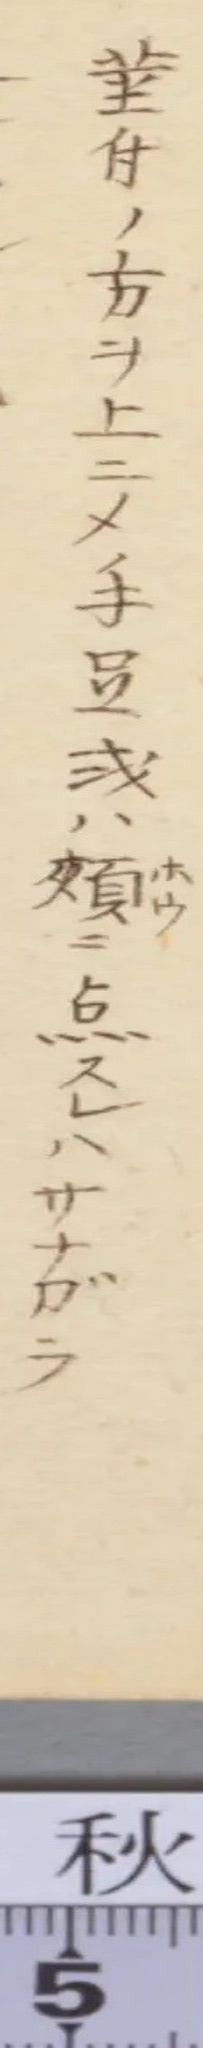茎付ノ方ヲ上ニシテ手足或ハ頬ニ点スレハサナガラ
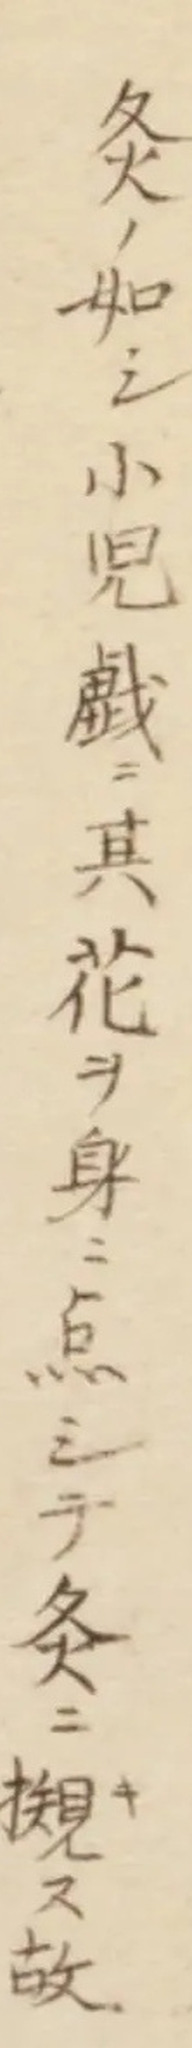灸ノ如シ小児戯其花ヲ身点シテ灸ニ𭬉ス故
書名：梅園草木花譜秋之部. 2
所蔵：国立国会図書館 National Diet Library, JAPAN
